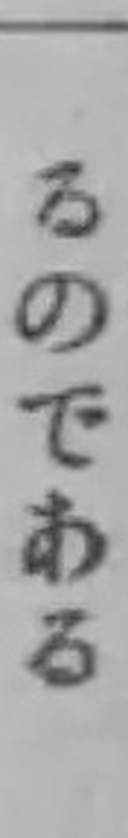るのである
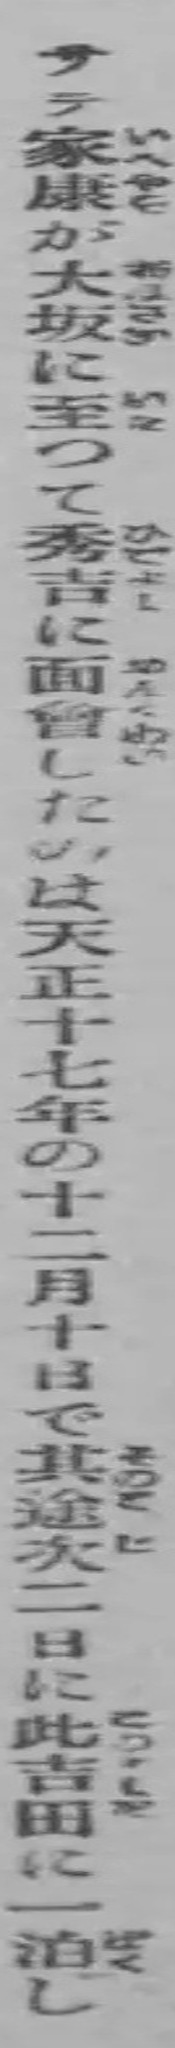サテ家康が大坂に至つて秀吉に面会したのは天正十七年の十二月十日で其途次二日に此吉田に一泊し
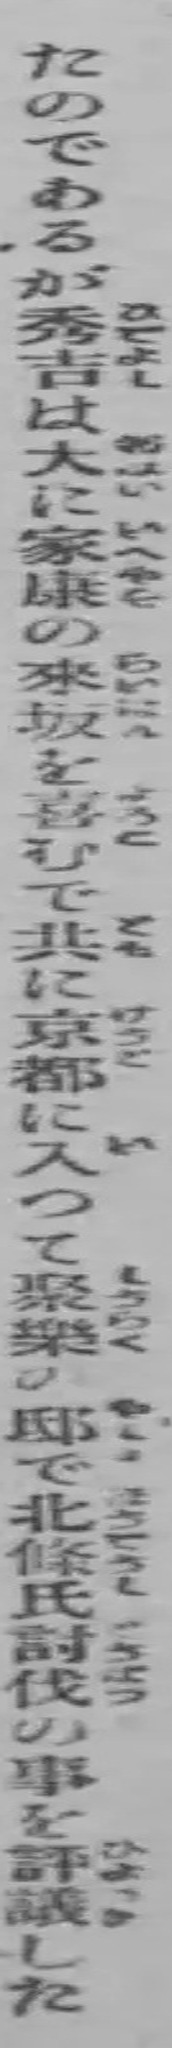たのであるが秀吉は大に家康の来坂を喜むで共に京都に入つて聚楽の邸で北條氏討伐の事を評議した
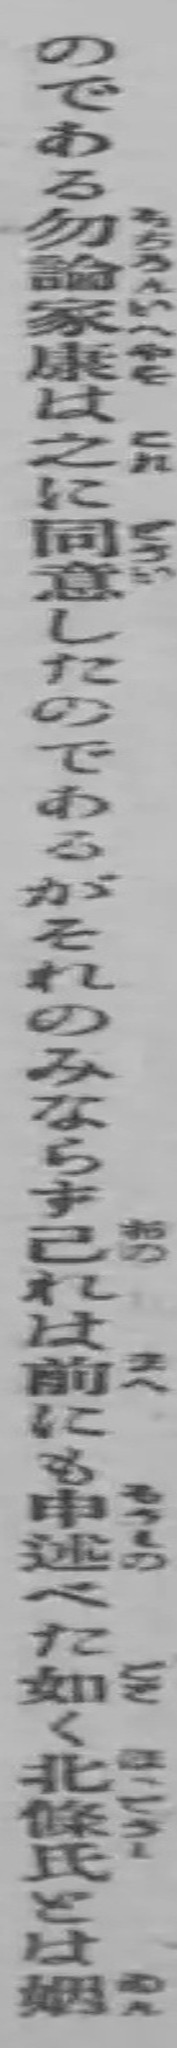のである勿論家康は之に同意したのであるがそれのみならず己れは前にも申述べた如く北條氏とは姻
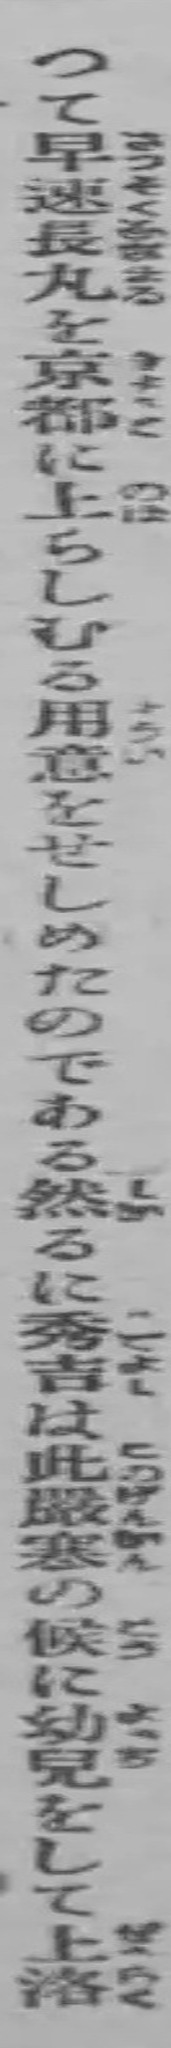つて早速長丸を京都に上らしむる用意をせしめたのである然るに秀吉は此厳寒の候に幼児をして上洛
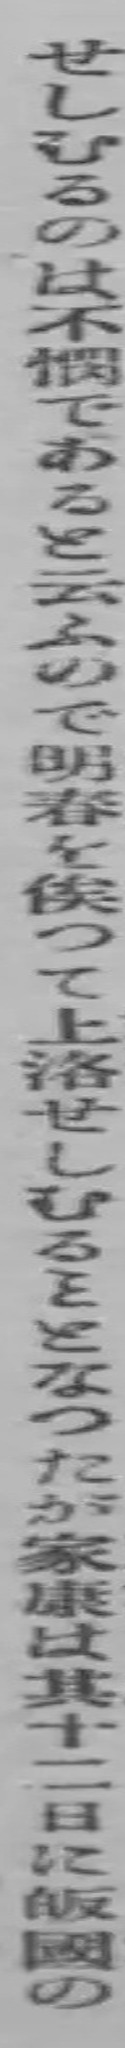せしむるのは不憫であると云ふので明春を俟つて上洛せしむることとなつたが家康は其十二日に皈国の
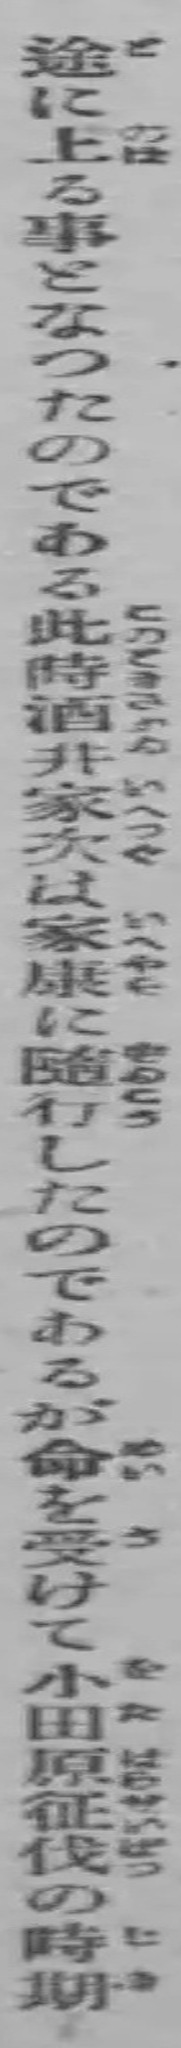家康の伝令途に上る事となつたのである此時酒井家次は家康に随行したのであるが命を受けて小田原征伐の時期
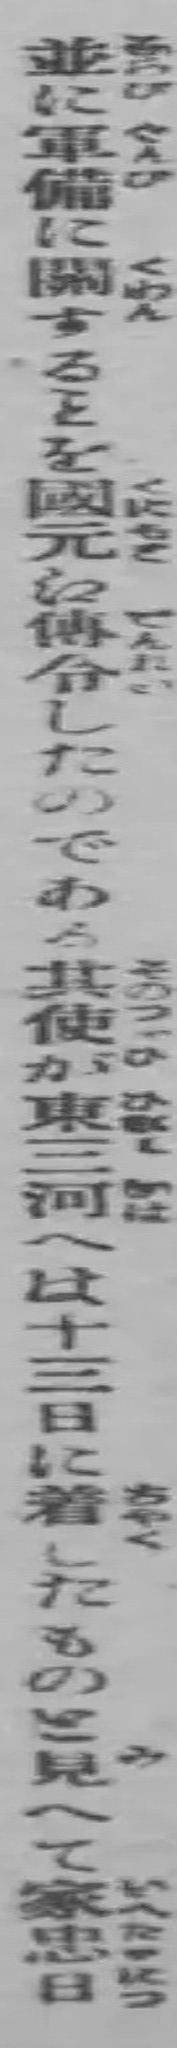並に軍備に関することを国元え伝令したのである其使が東三河へは十三日に着したものと見へて家忠日
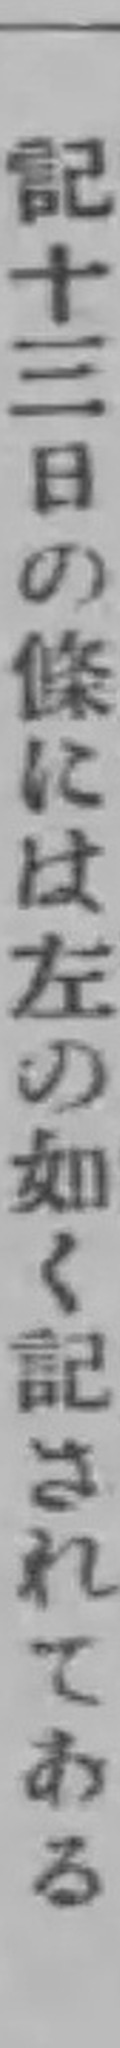記十三日の条には左の如く記されてある
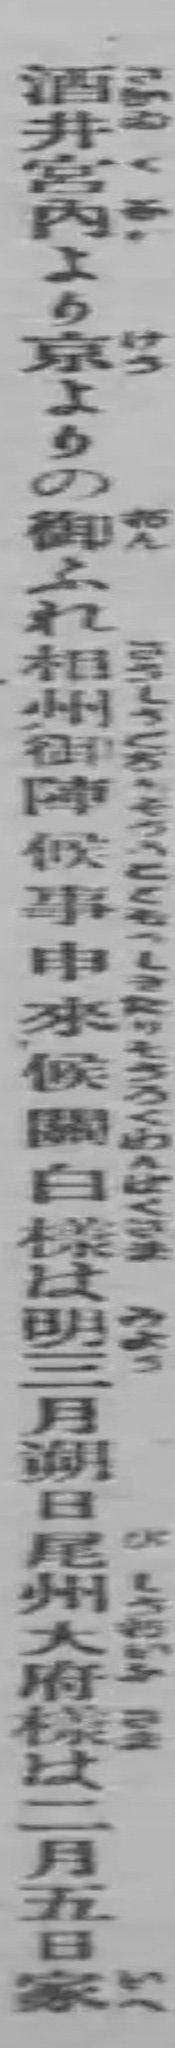酒井宮内より京よりの御ふれ相州御陣候事申来候関白様は明三月朔日尾州大府様は二月五日家
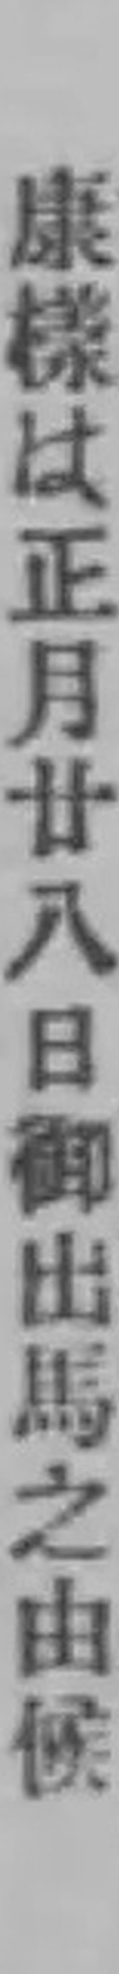康様は正月廿八日御出馬之由候
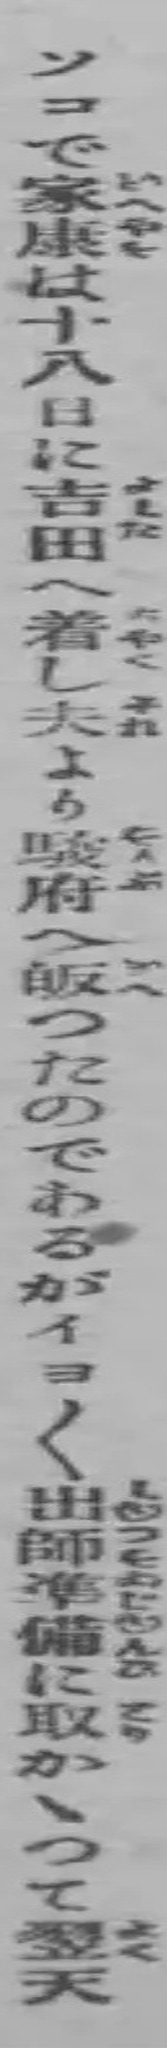ソコで家康は十八日に吉田へ着し夫より駿府へ皈つたのであるがイヨ〳〵出師準備に取かゝつて翌天
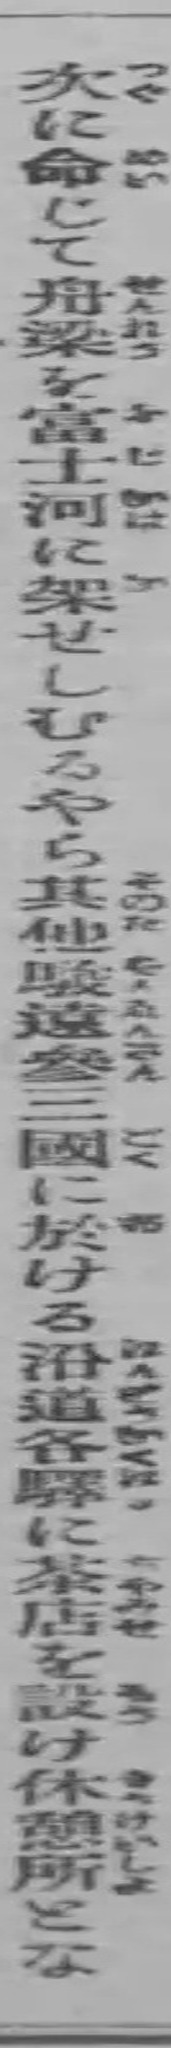次に命じて舟梁を富士河に架せしむるやら其他駿遠参三国に於ける沿道各駅に茶店を設け休憩所とな
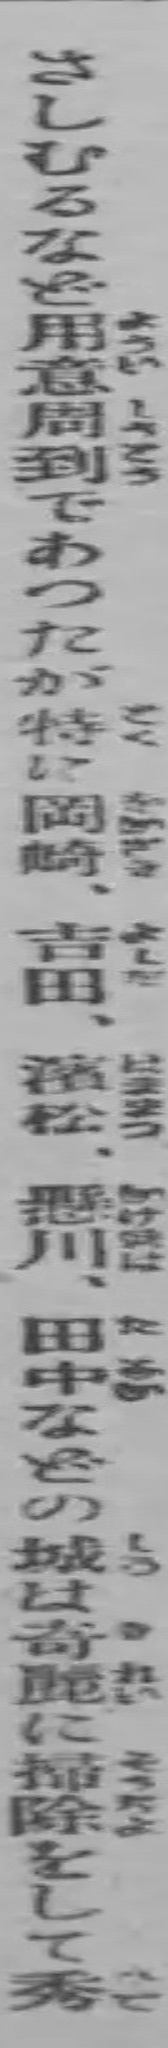さしむるなど用意周到であつたが特に岡崎、吉田、浜松、掛川、田中などの城は綺麗に掃除をして秀
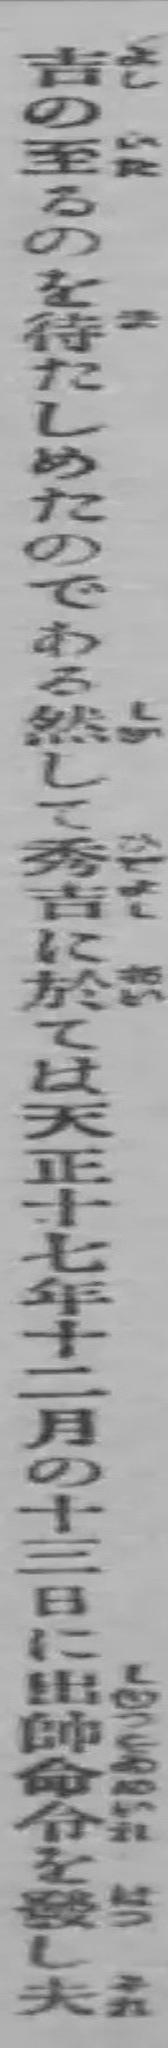吉の至るのを待たしめたのである然して秀吉に於ては天正十七年十二月の十三日に出師命令を発し夫
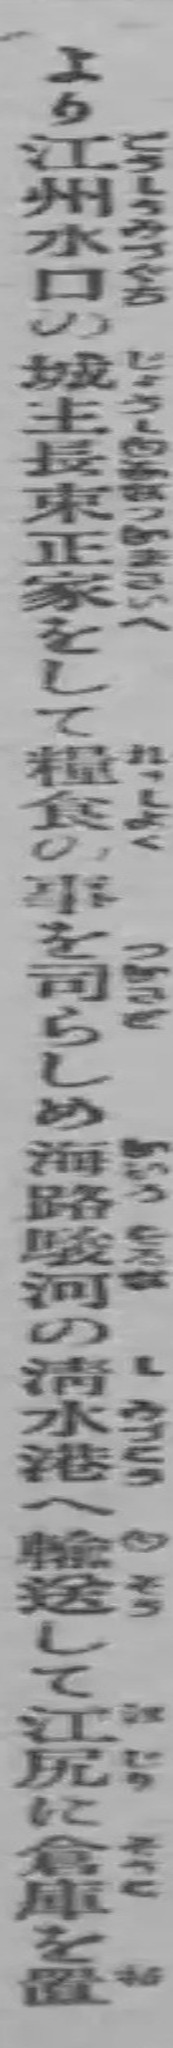より江州水口の城主長束正家をして糧食の事を司らしめ海路駿河の清水港へ輸送して江尻に倉庫を置
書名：豊橋市史談
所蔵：国立国会図書館 National Diet Library, JAPAN
